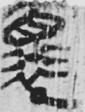褱（懷）
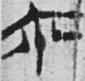尔（爾）
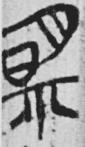○（明）
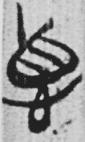惪（德）
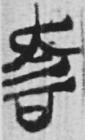害
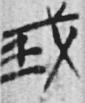城（誠）
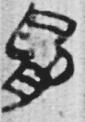{胃刀}（謂）
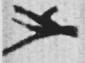之
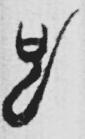也
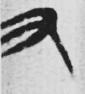又（有）
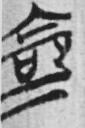命
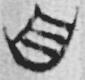自
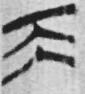天
